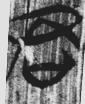君
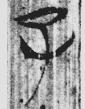子
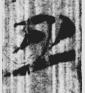之
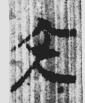內（入）
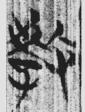教
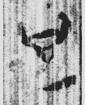也
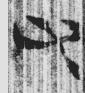又（有）
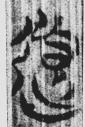道
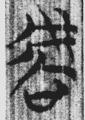○（乎）
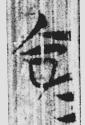孔子
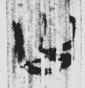曰
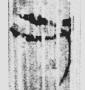又（有）
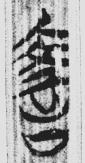○（顏）
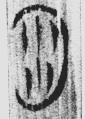囦（淵）
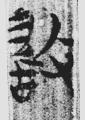敢（敢）
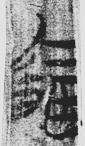{尒䎽}（問）
